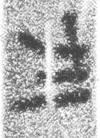生
